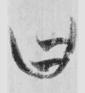曰
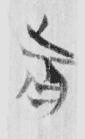歬
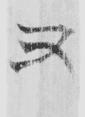又
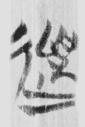道
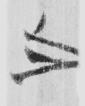之
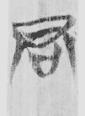君
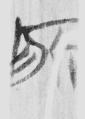所
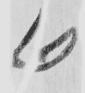㠯（以）
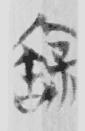{宀缶呆}
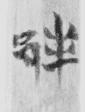邦
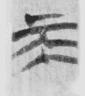天
